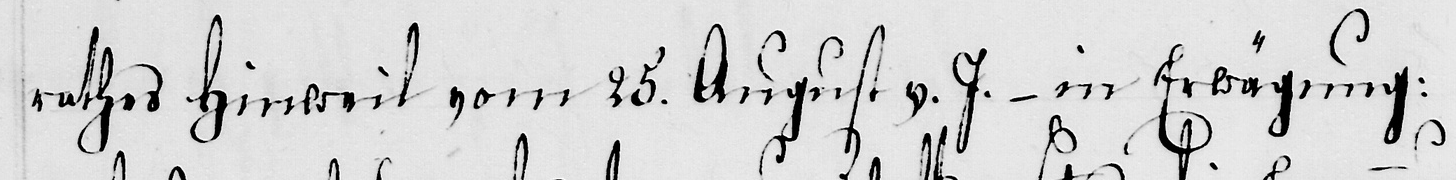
rathes Hinweil vom 25. August v. J. – in Erwägung:
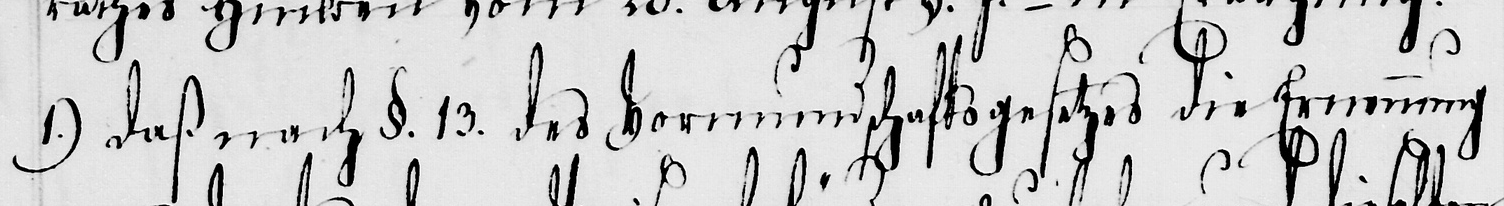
1.) Daß nach §. 13. des Vormundschaftsgesetzes die Ernennung
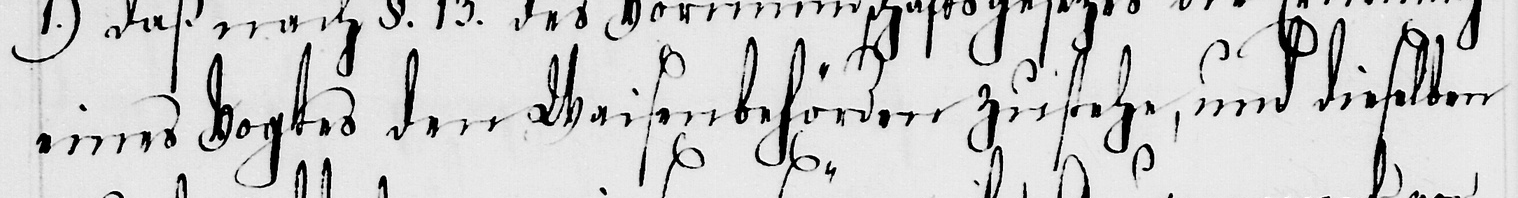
eines Vogtes den Waisenbehörden zustehe, und dieselben
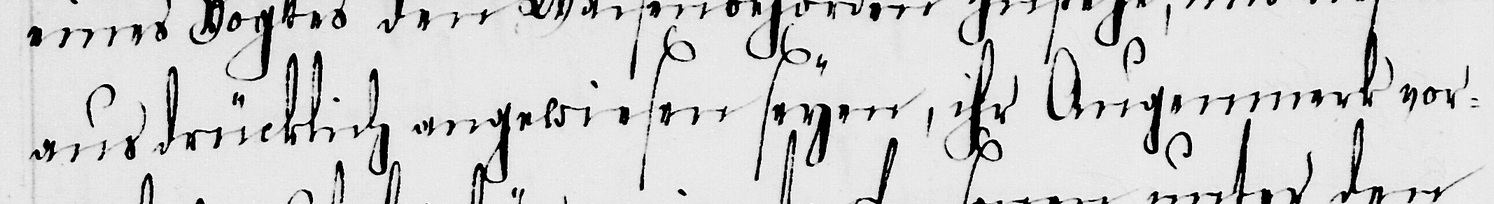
ausdrücklich angewiesen seyen, ihr Augenmerk vor¬
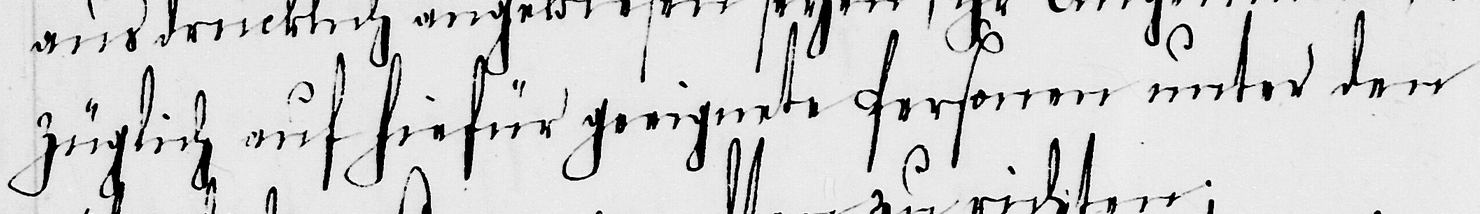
züglich auf hiefür geeignete Personen unter den
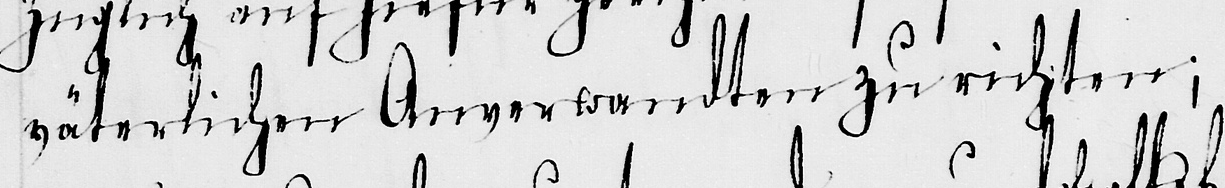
väterlichen Anverwandten zu richten;
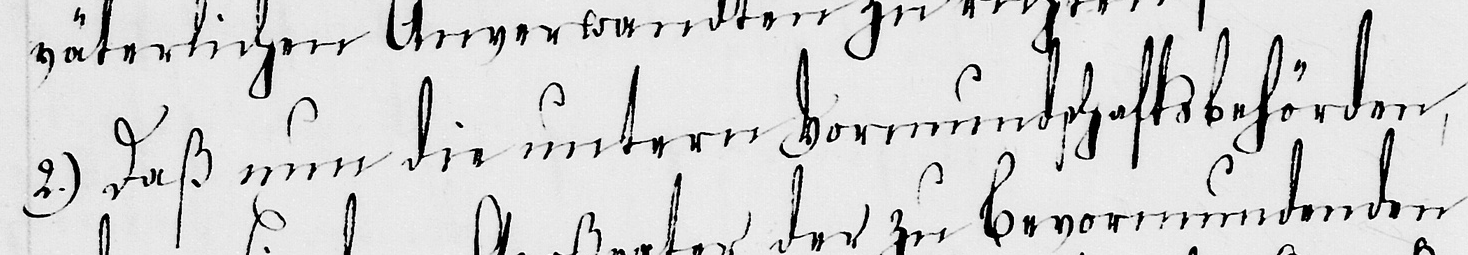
2.) Daß nun die untern Vormundschaftsbehörden,
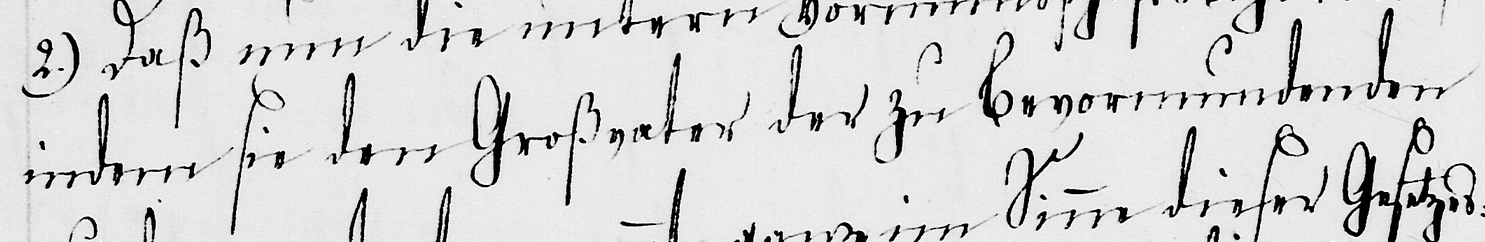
indem sie den Großvater der zu Bevormundenden
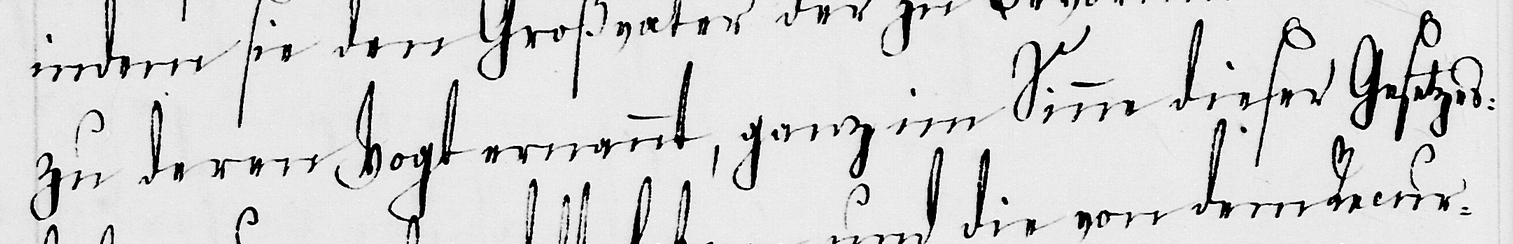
zu deren Vogt ernannt, ganz im Sinne dieser Gesetz¬
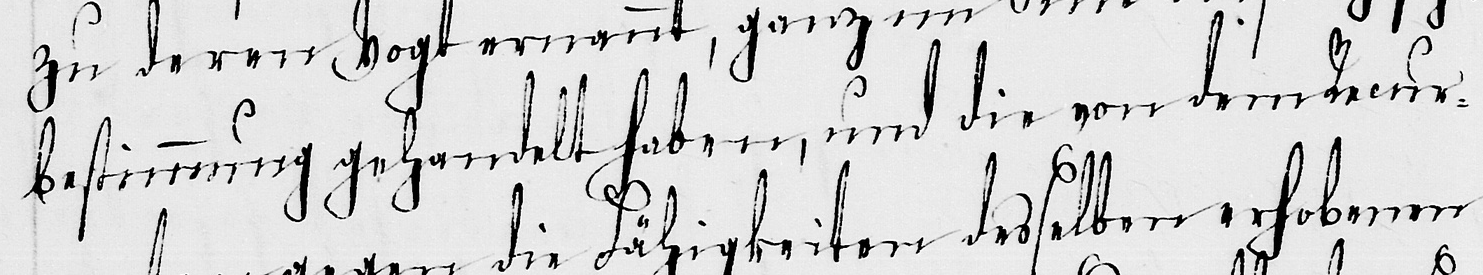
bestimmung gehandelt haben, und die von dem Recur¬
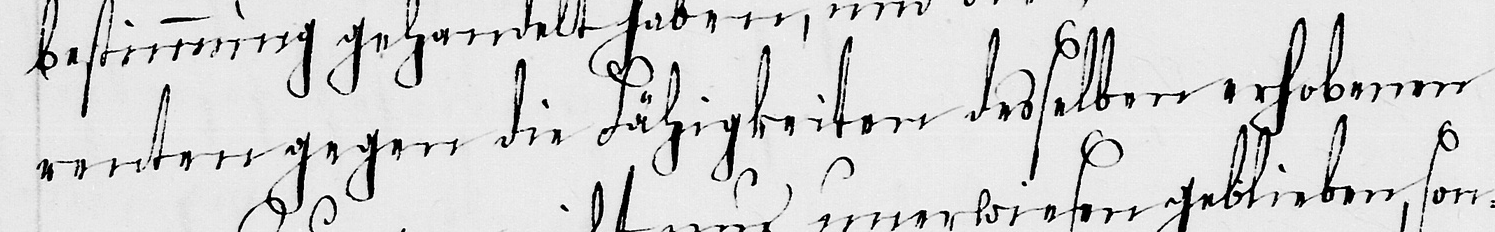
renten gegen die Fähigkeiten desselben erhobenen
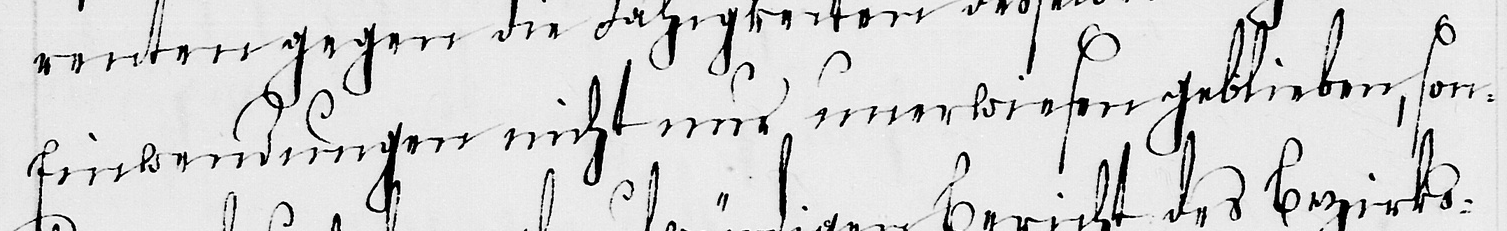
Einwendungen nicht nur unerwiesen geblieben, son¬
